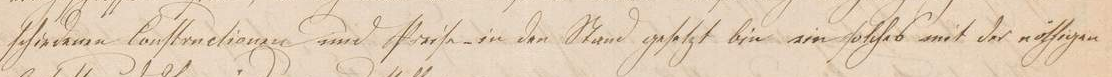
schiedenen Constructionen und Preise – in den Stand gesetzt bin ein solches mit der nöthigen
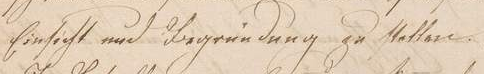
Einsicht und Begründung zu stellen.
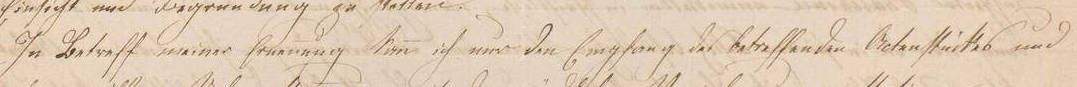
In Betreff meiner Ernennung kann ich nur den Empfang des betreffenden Actensstücktes und
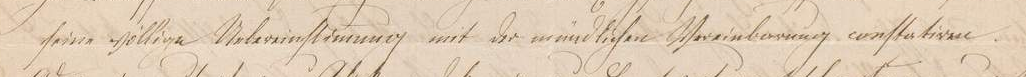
seine völlige Uebereinstimmung mit der mündlichen Vereinbarung constatiren.
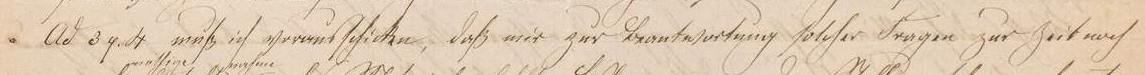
Ad 3 & 4 muß ich vorausschicken, daß mir zur Beantwortung solcher Fragen zu Zeit noch
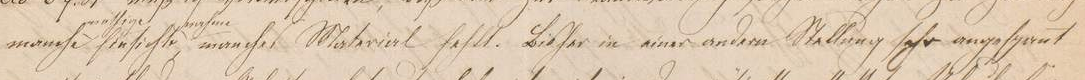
Einsichts nahme, manches Material fehlt. Bisher in einer andern Stellung sehr angespannt
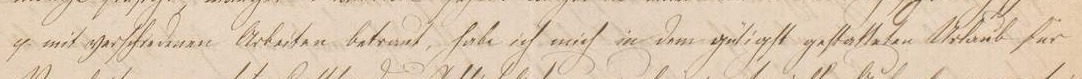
& mit verschiedenen Arbeiten betraut, habe ich mich in dem gütigst gestatteten Urlaub für
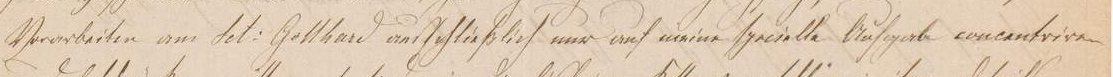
Vorarbeiten am Sct: Gotthard ausschließlich nur auf meine specielle Aufgabe concentriren
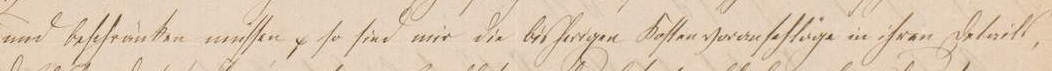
und beschränken müssen & so sind mir die bisherigen Kostenvoranschläge in ihren Details,
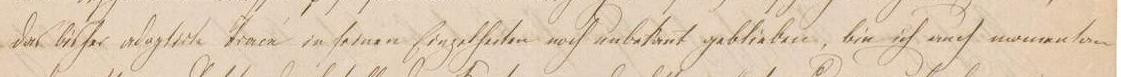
das bisher adaptirte Tracé in seinen Einzelheiten noch unbekannt geblieben, bin ich auch momentan
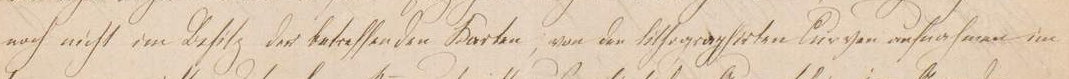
noch nicht in Besitz der betreffenden Karten, von den litographirten Curvenaufnahmen im
